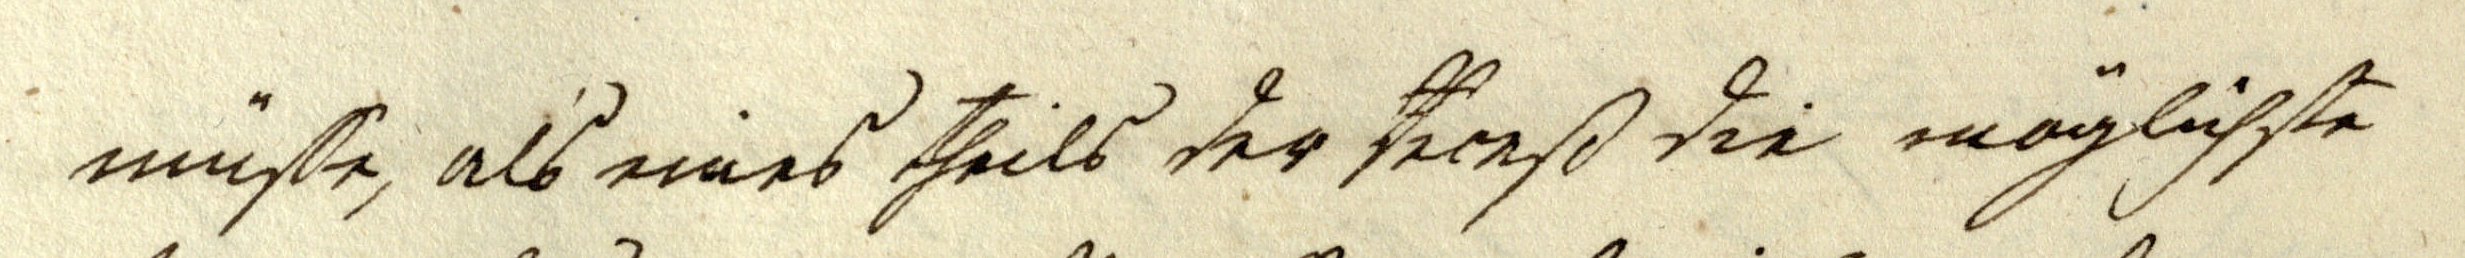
müsse, als eines theils der Receß die möglichste
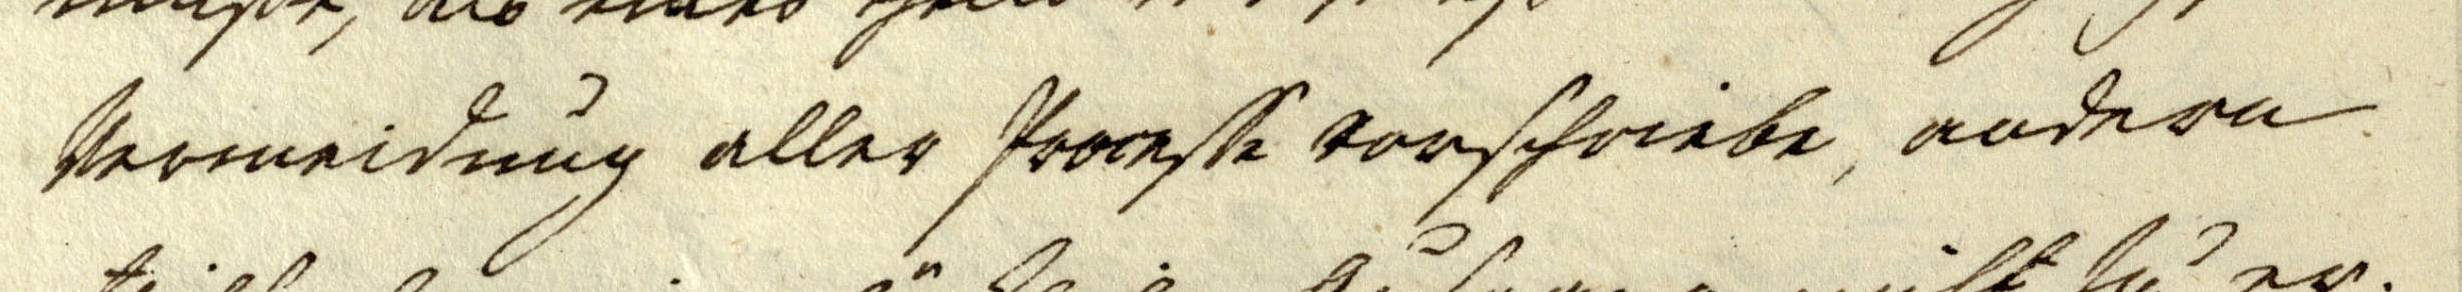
Vermeidung aller Processe vorschriebe, andern
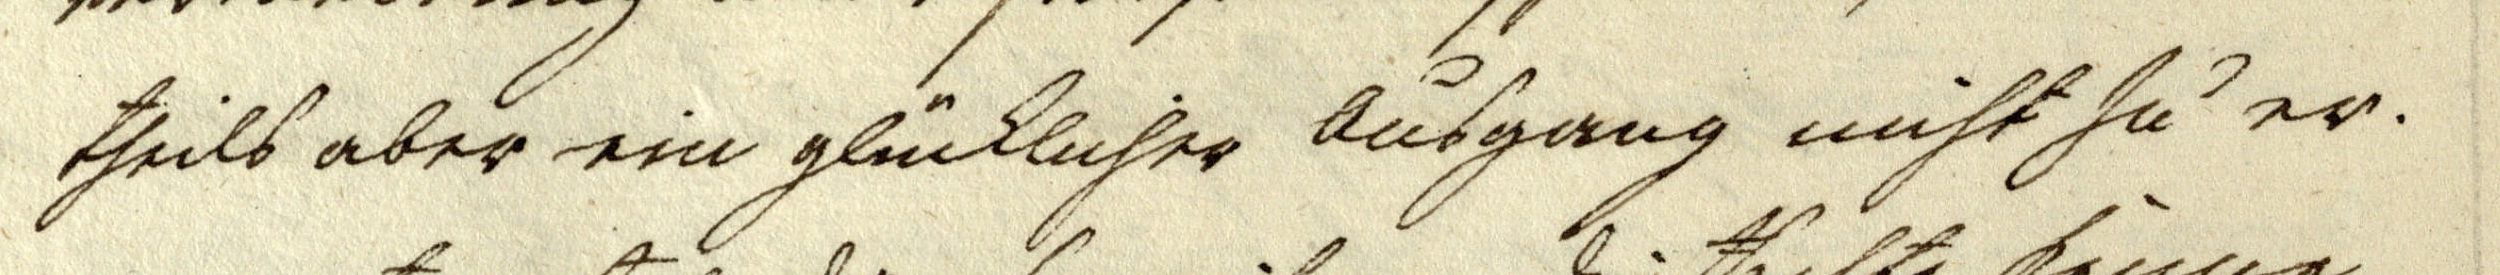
theils aber ein glücklicher Ausgang nicht zu er¬
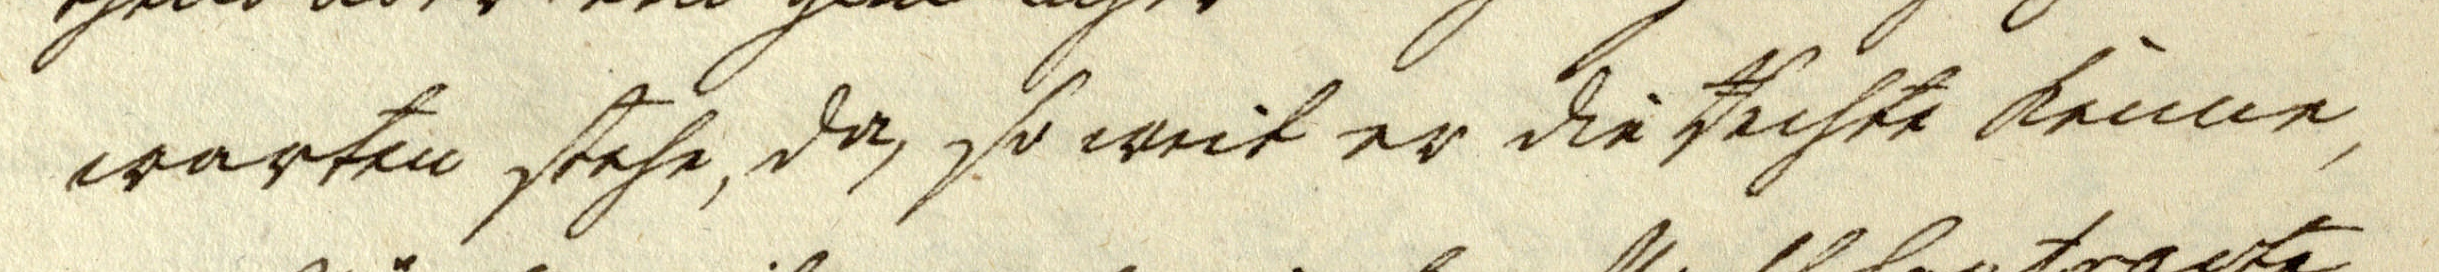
warten stehe, da, so weit er die Rechte kenne,
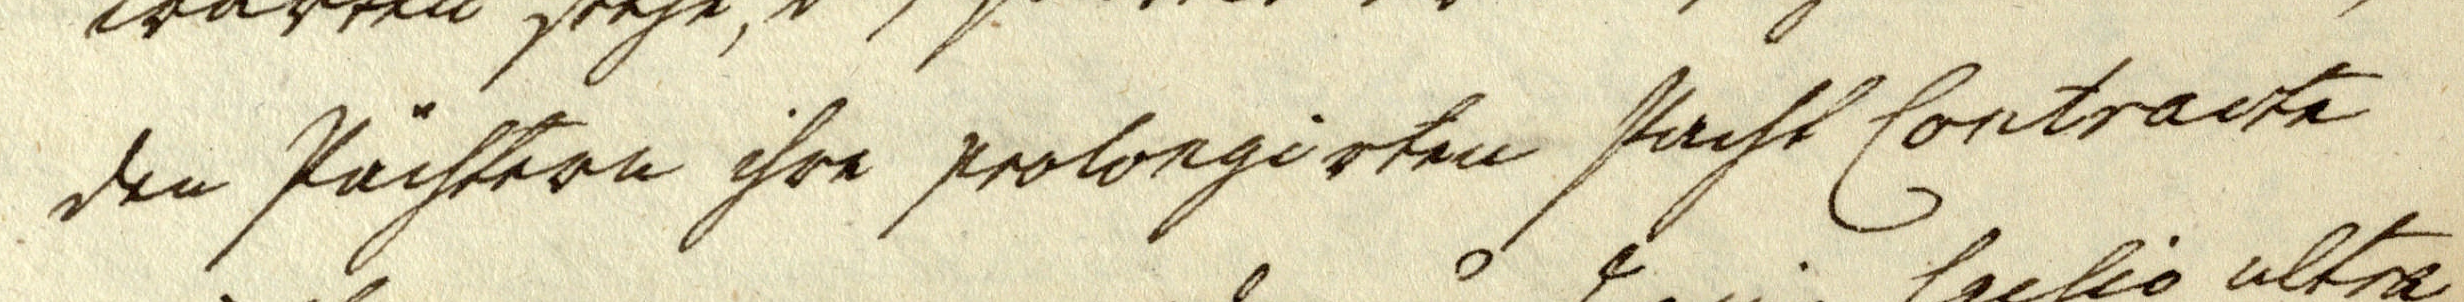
den Pächtern ihre prolongirten Pacht Contracte
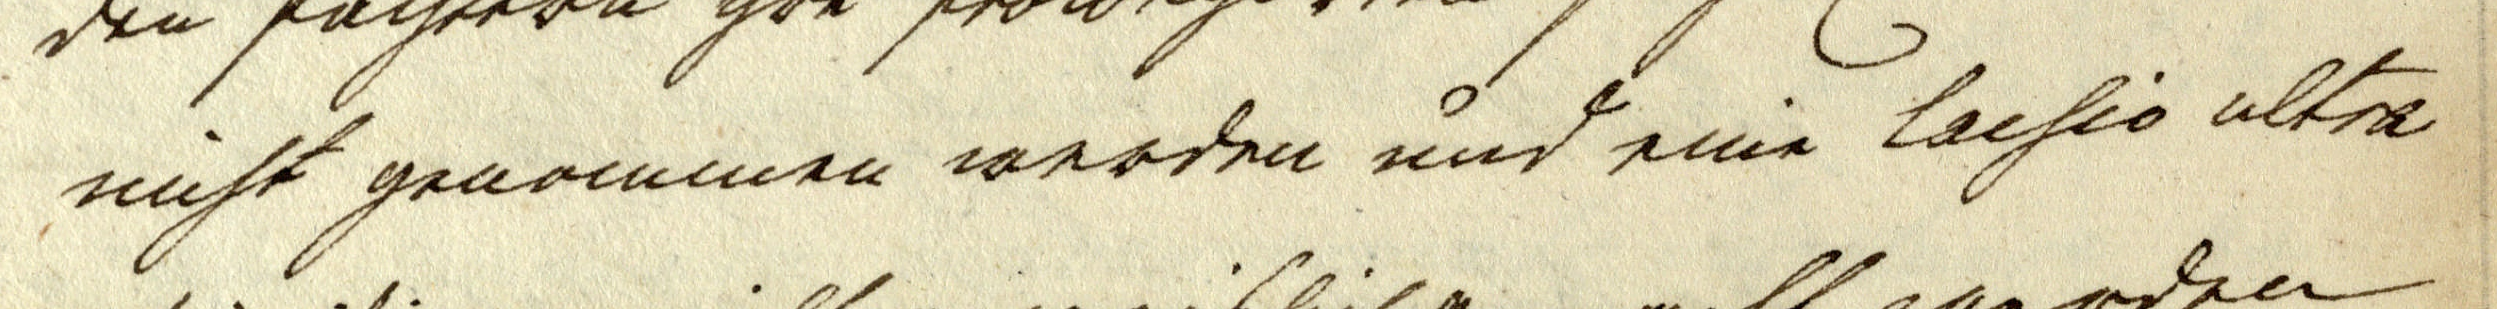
nicht genommen werden und eine laesio ultra¬
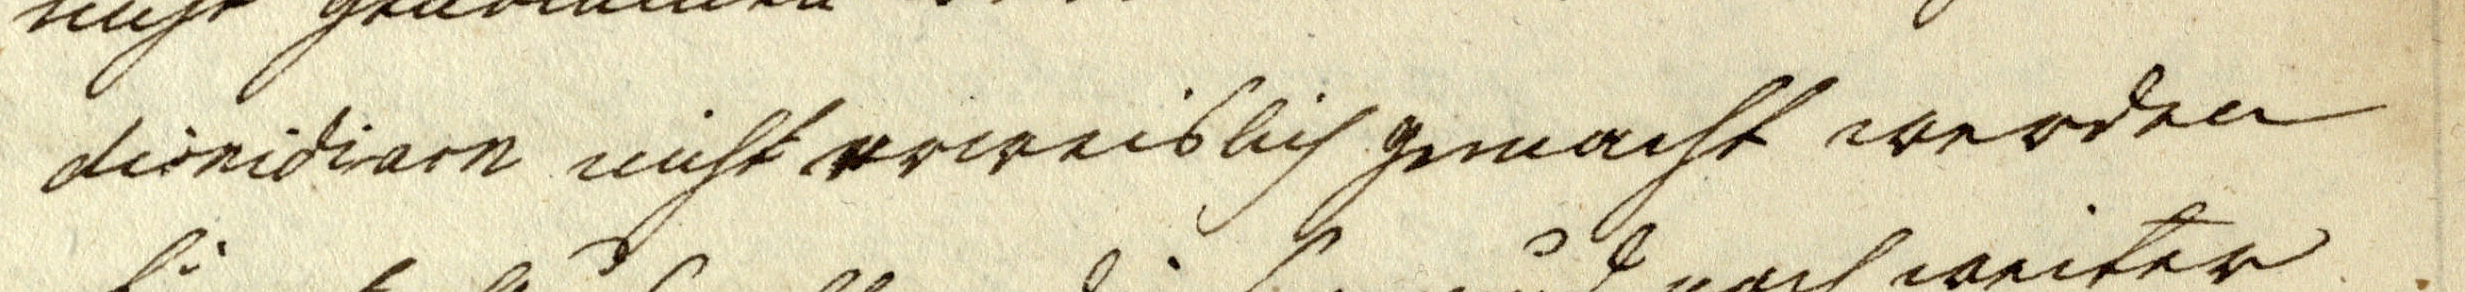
dimidiam nicht erweislich gemacht werden
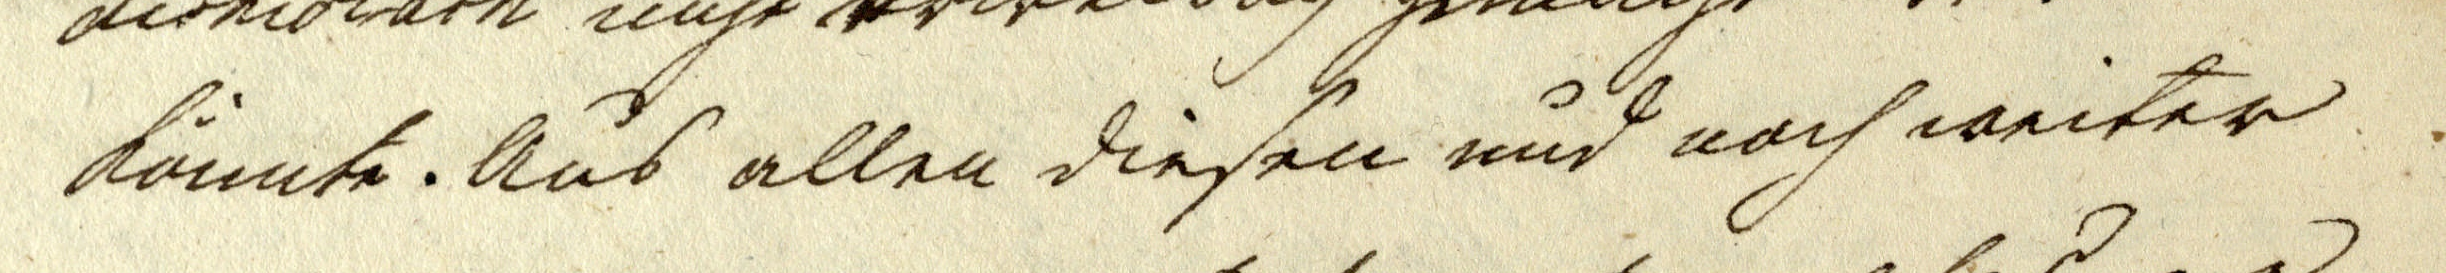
könnte. Aus allen diesen und noch weiter
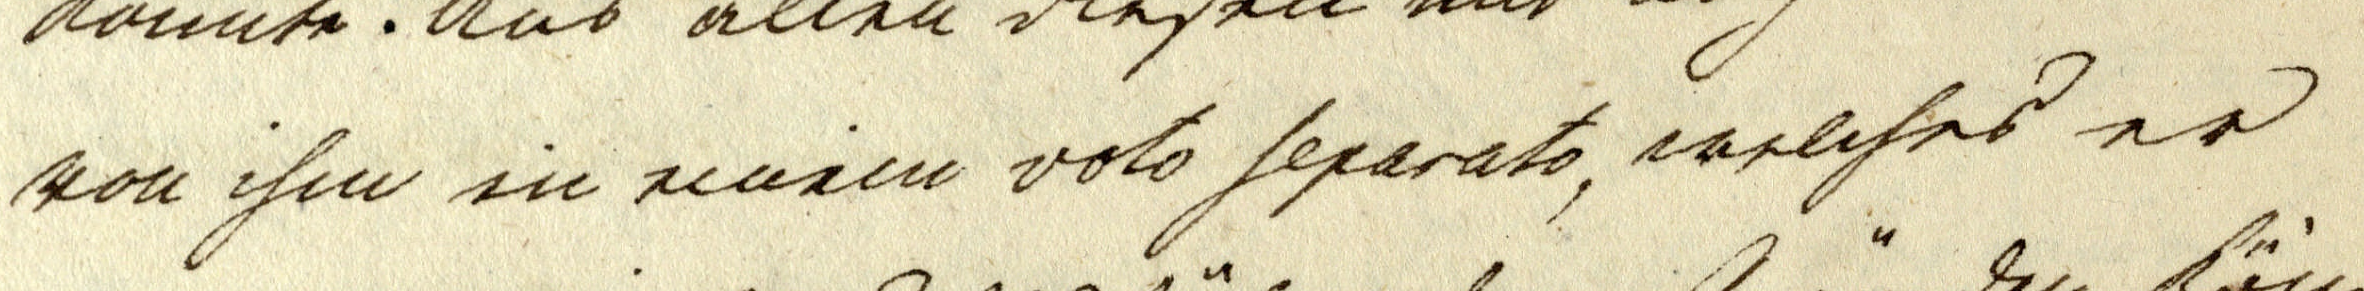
von ihm in einem voto separato, welches er
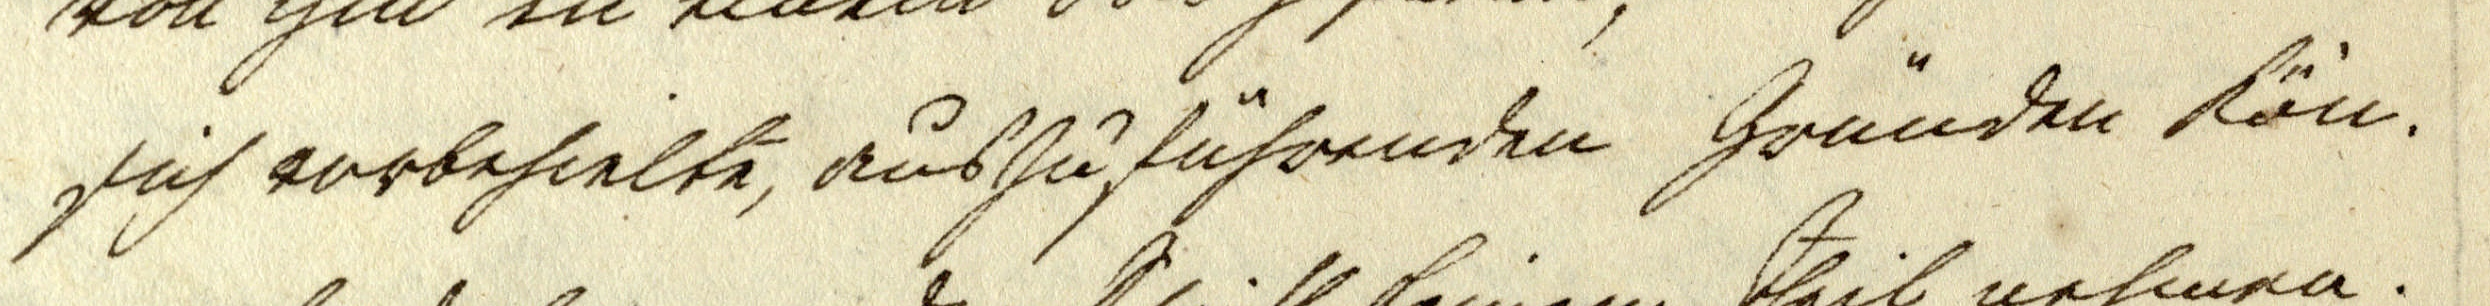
sich vorbehielte, auszuführenden Gründen kön¬
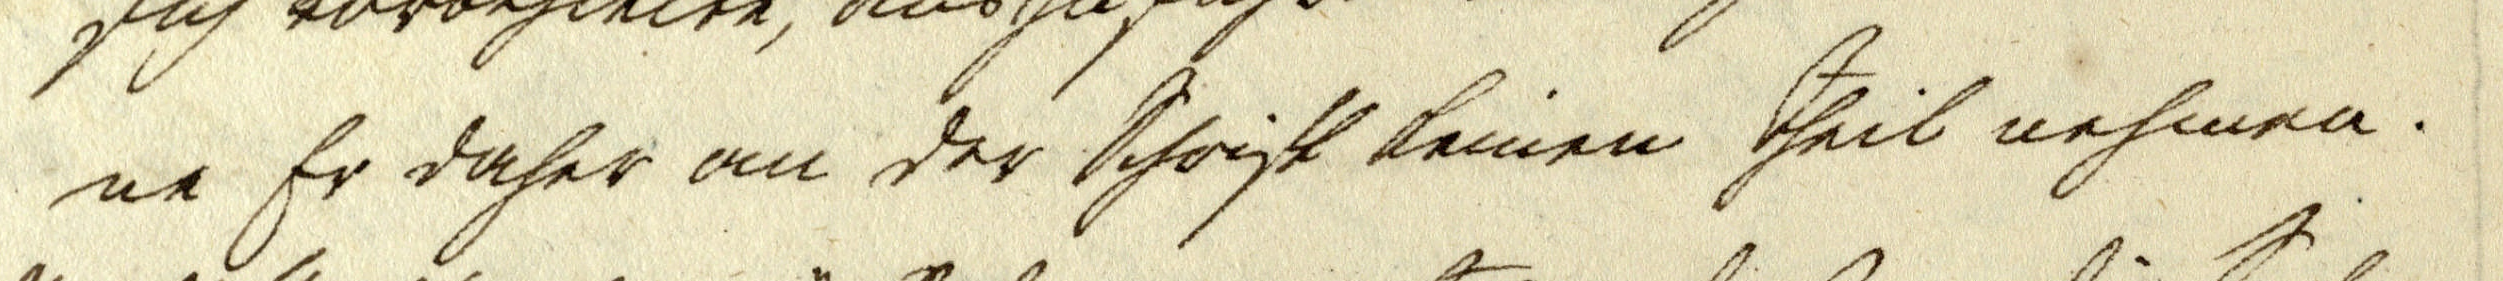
ne Er daher an der Schrift keinen Theil nehmen.
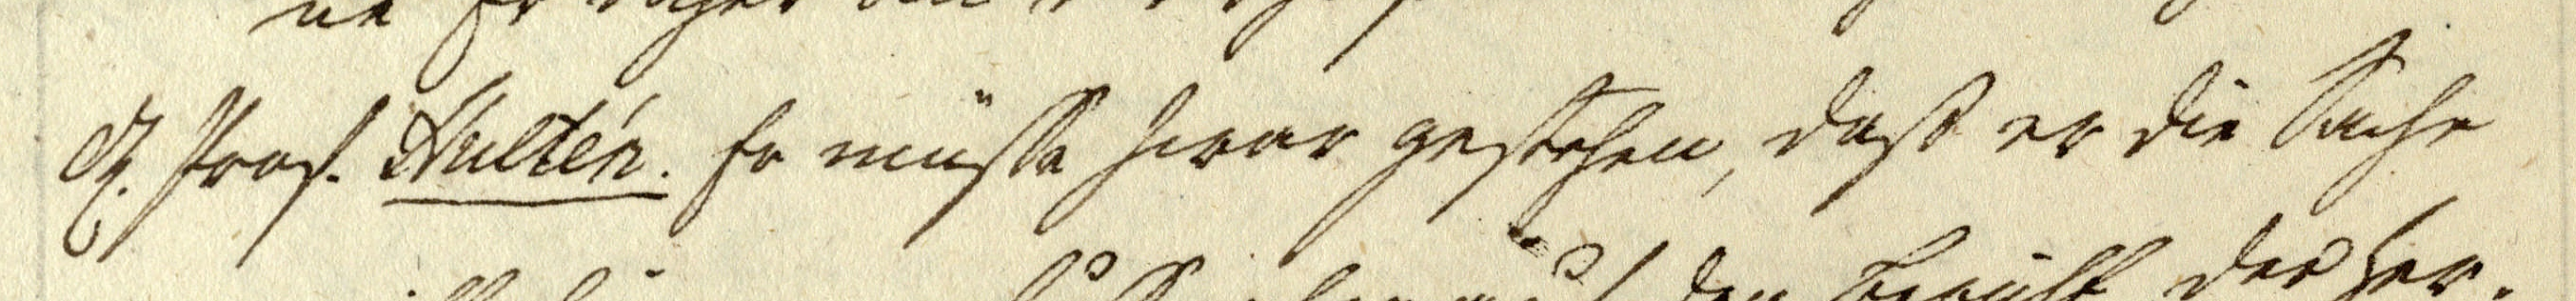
dh. Prof. Hultén. Er müsse zwar gestehen, daß er die Sache
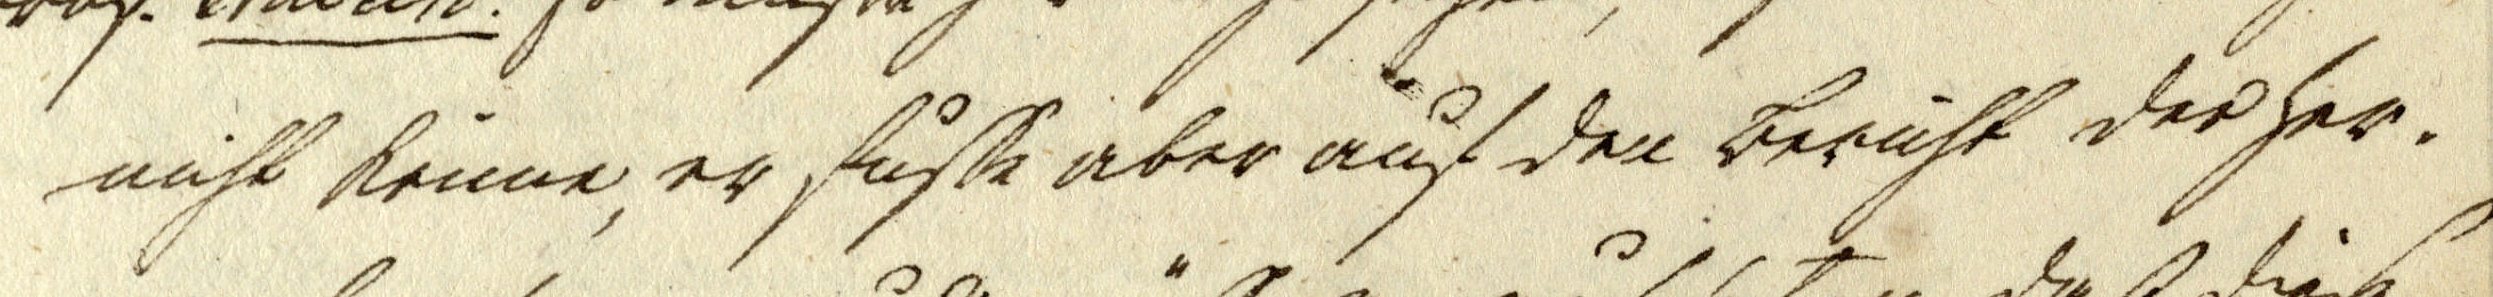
nicht kenne er fusse aber auf den Bericht der Her¬
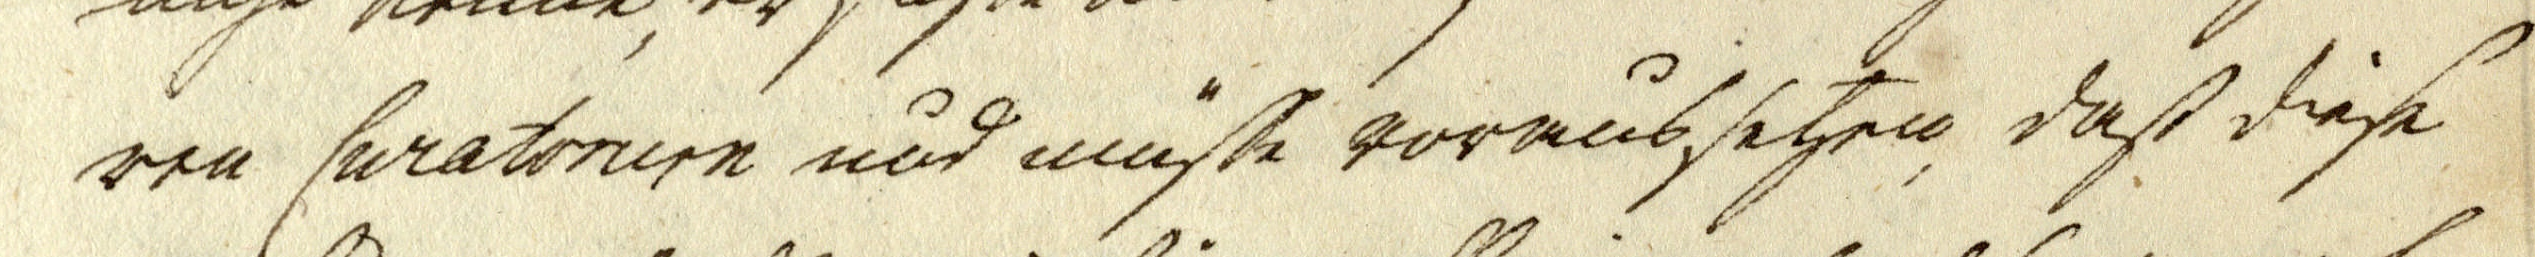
ren Curatorum und müsse voraussetzen, daß diese
